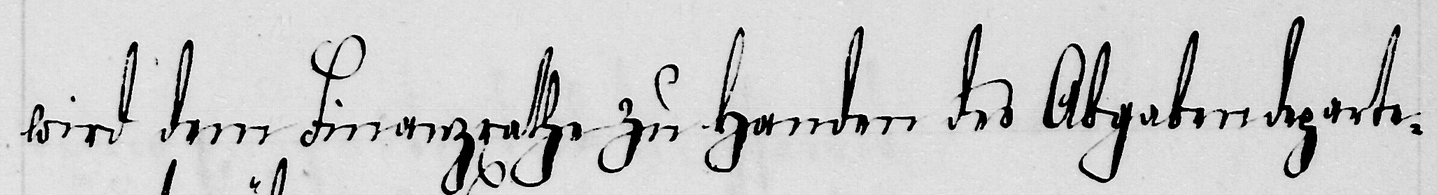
wird dem Finanzrathe zu Handen des Abgabendeparte¬
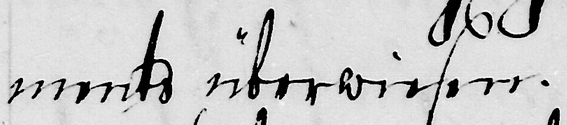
ments überwiesen.
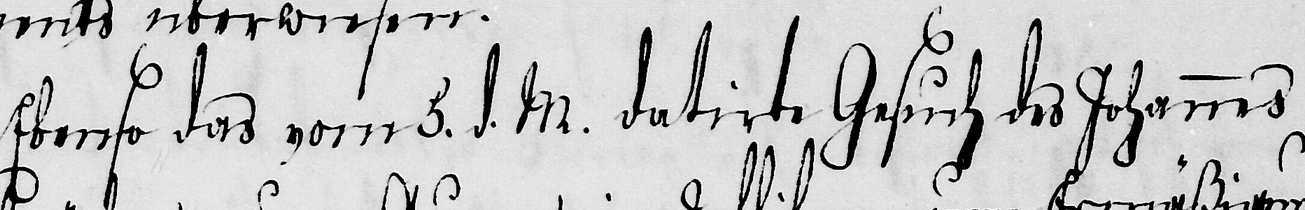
Ebenso das vom 5. d. M. datirte Gesuch des Johannes
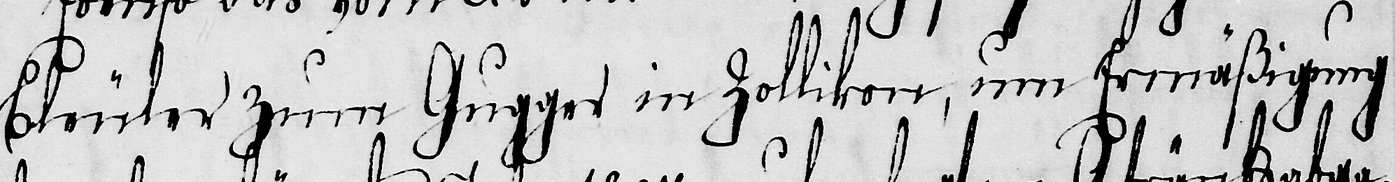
Bleuler zum Gugger in Zollikon, um Ermäßigung
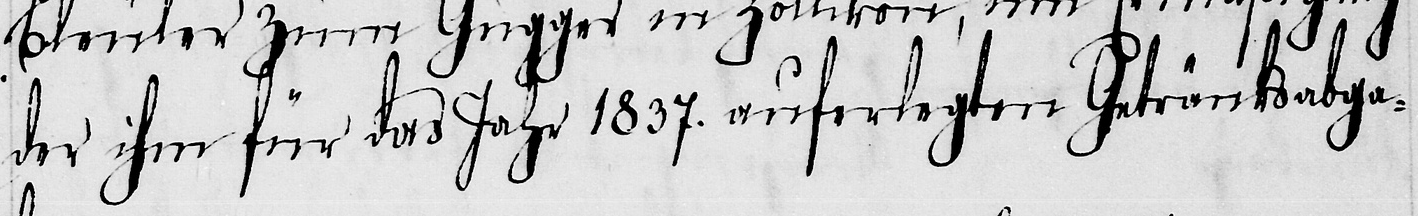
der ihm für das Jahr 1837. auferlegten Getränksabga¬
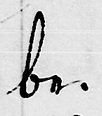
be¬
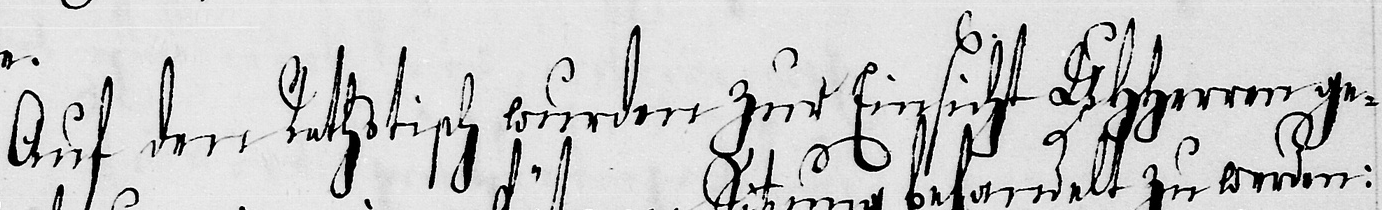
Auf den Rathstisch wurden Zur Einsicht UHHerren
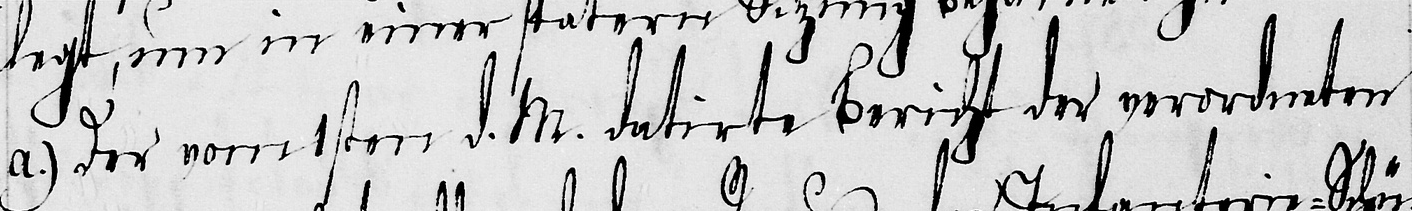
a.) der vom 1sten d. M. datirte Bericht der verordneten
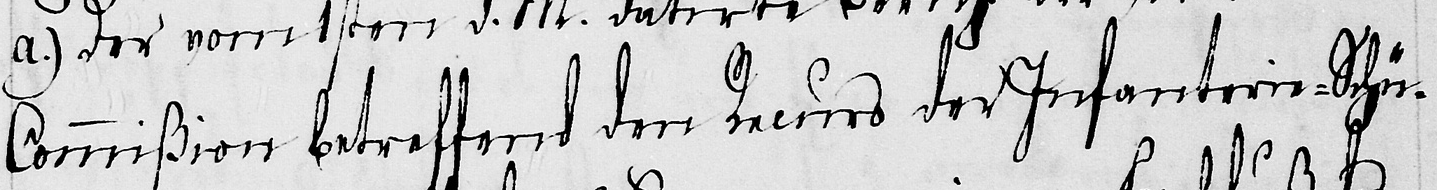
Commißion betreffend den Recurs der Infanterie-Schü¬
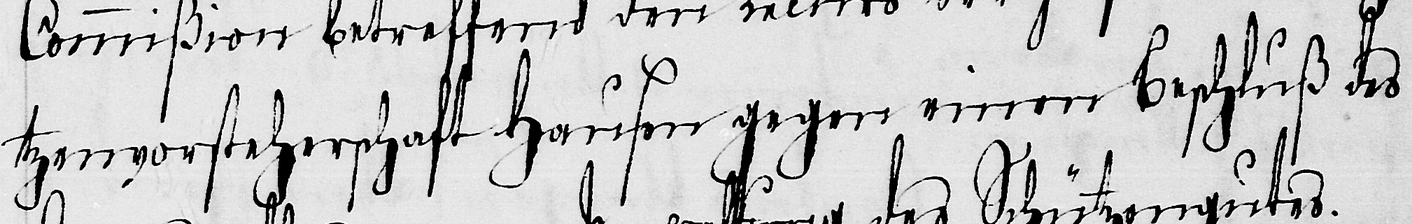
tzenvorsteherschaft Hausen gegen einen Beschluß des
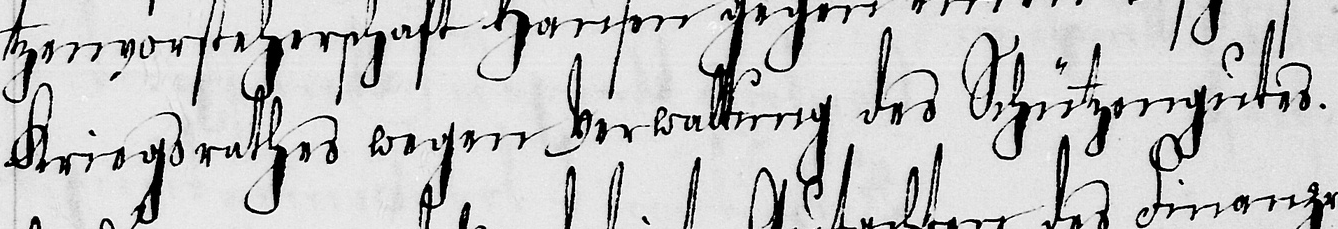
Kriegsrathes wegen Verwaltung des Schützengutes.
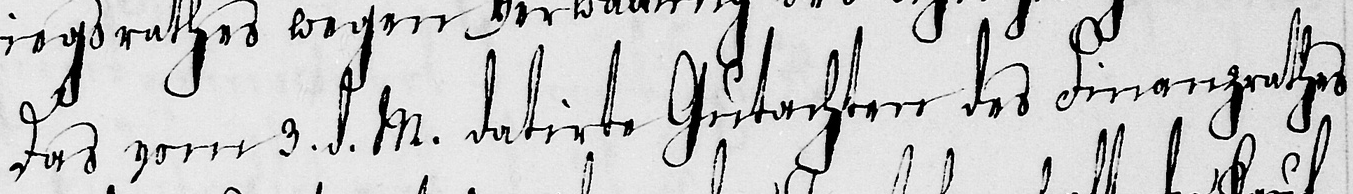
Das vom 3. d. M. datirte Gutachten des Finanzrathes
